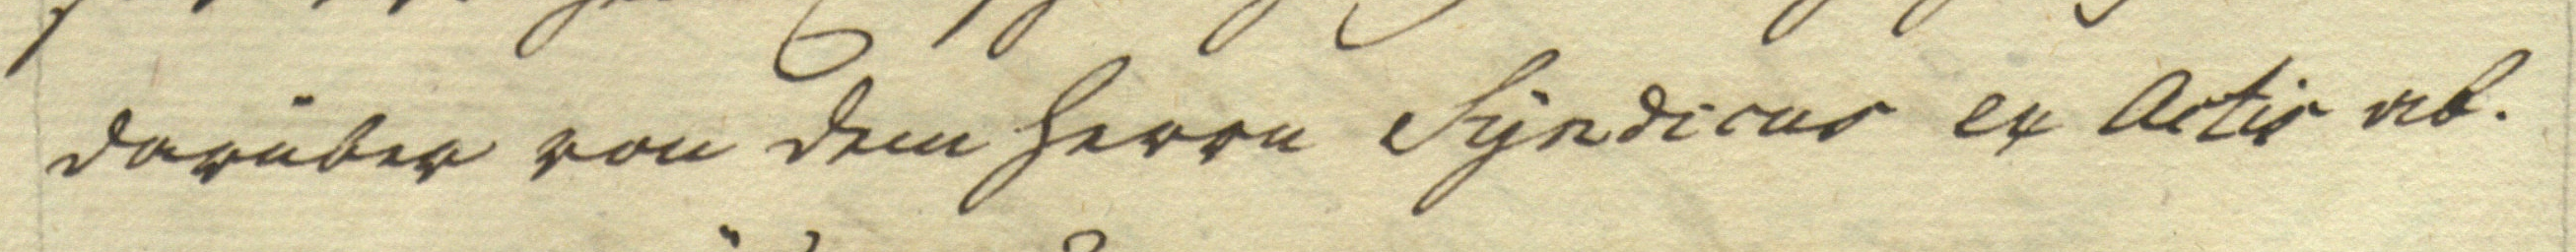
darüber von dem Herrn Sÿndicus ex Actis ab¬
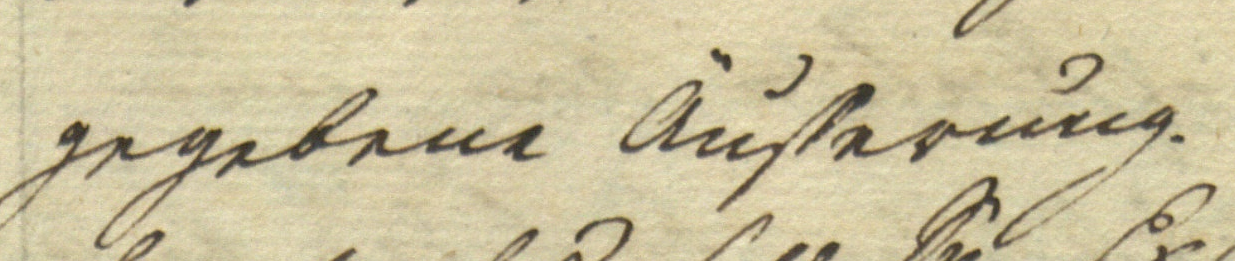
gegebene Äusserung.
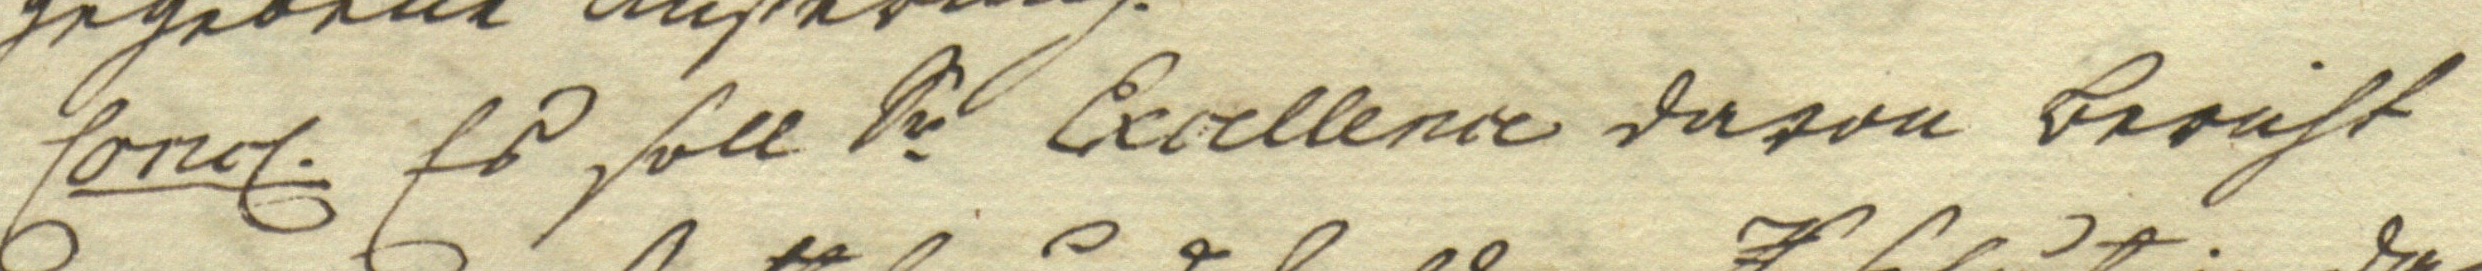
Concl. Es soll Sr Excellence davon Bericht
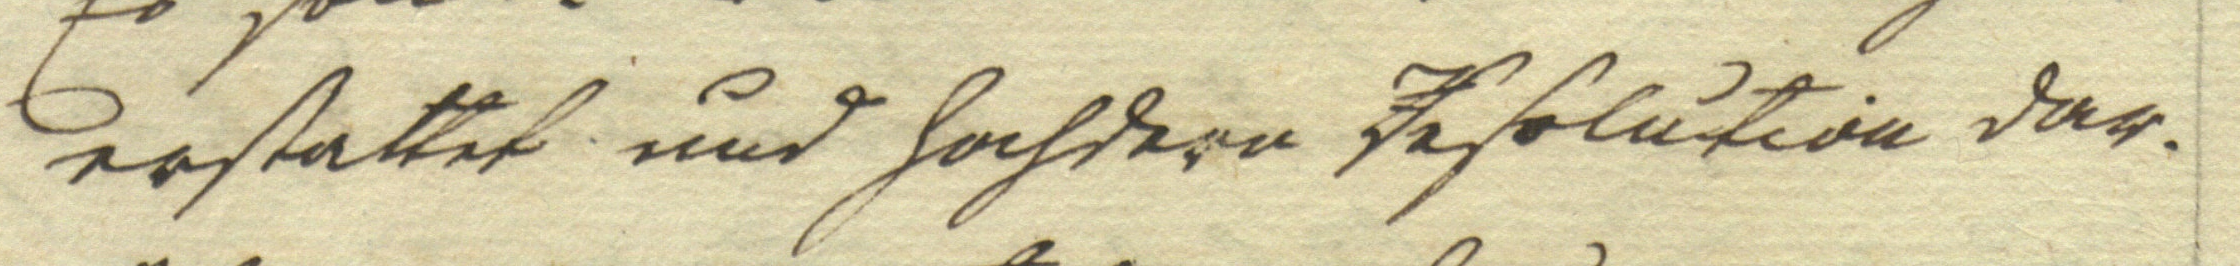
erstattet und hochderen Resolution dar¬
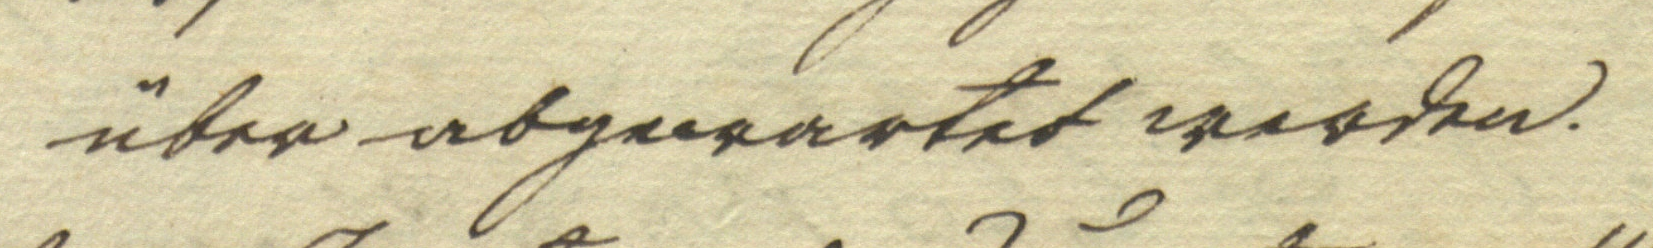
über abgewartet werden.
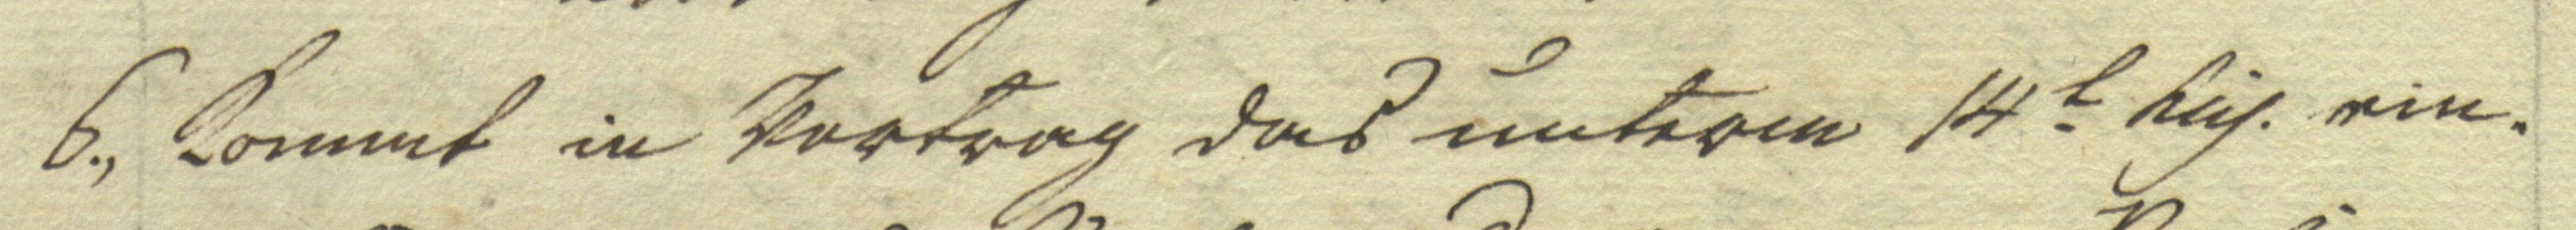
6., Kommt in Vortrag das unterm 14 t huj. ein¬
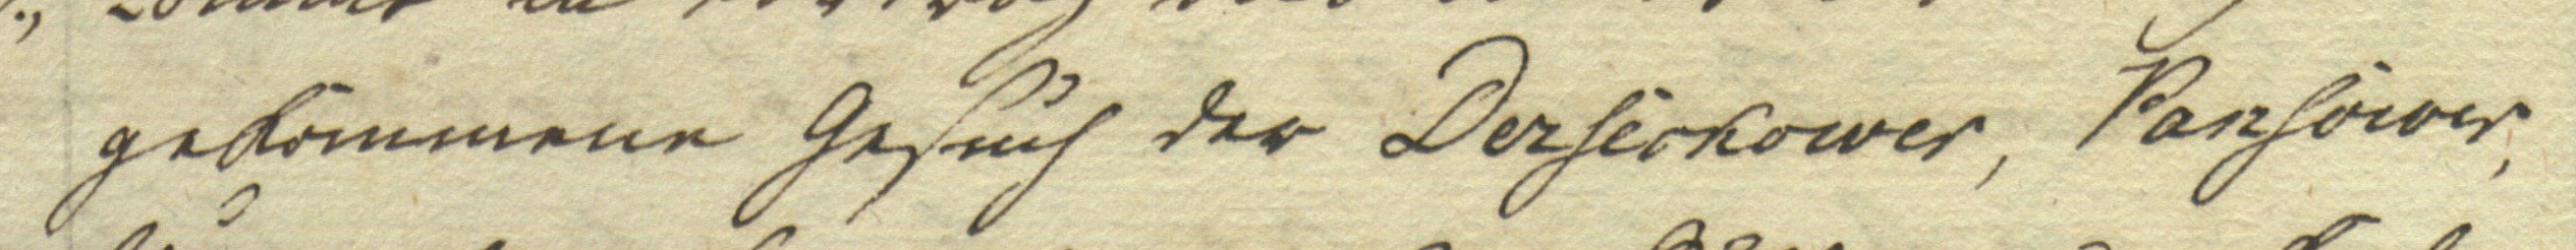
gekommene Gesuch der Derseckower, Pansower,
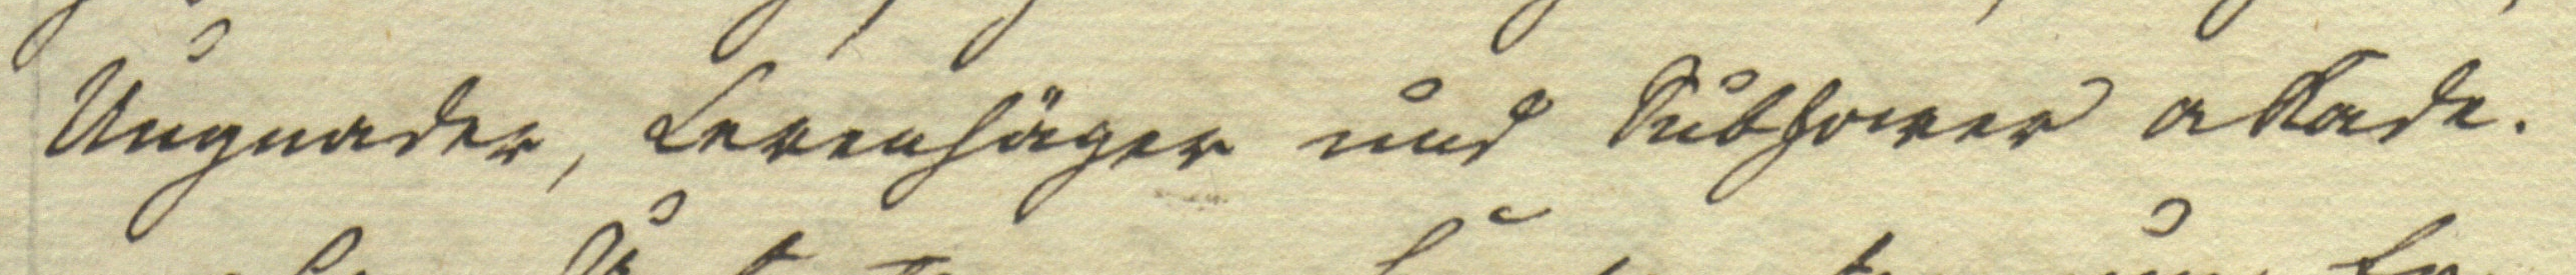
Ungnader, Levenhäger und Subzower akade¬
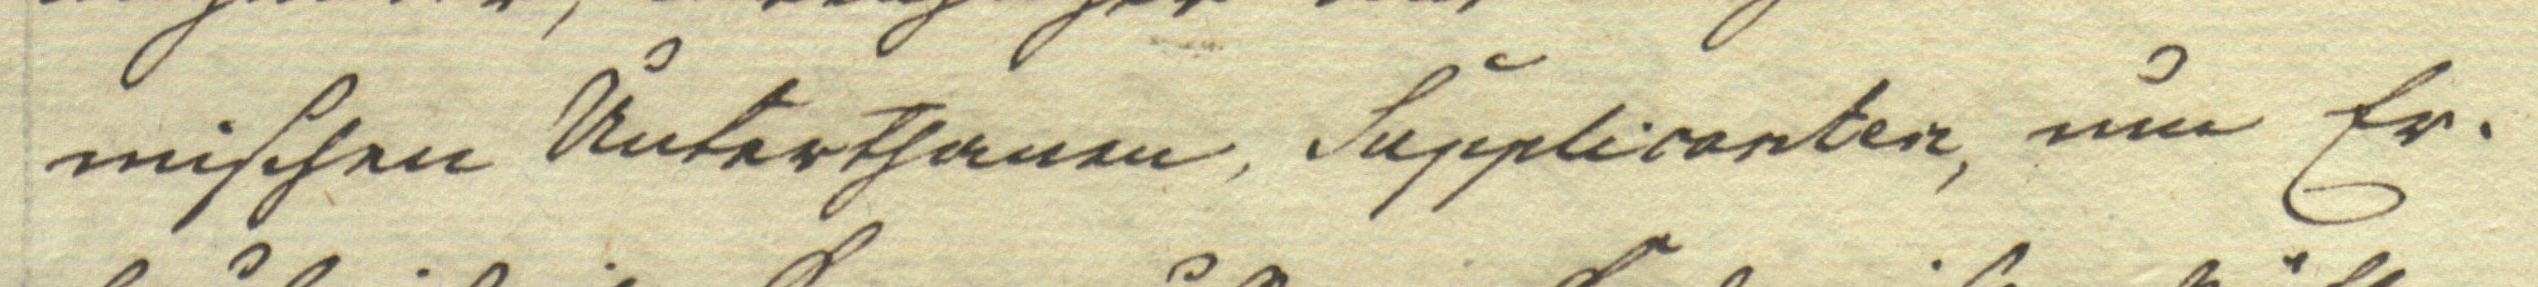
mischen Unterthanen, Supplicanten, um Er¬
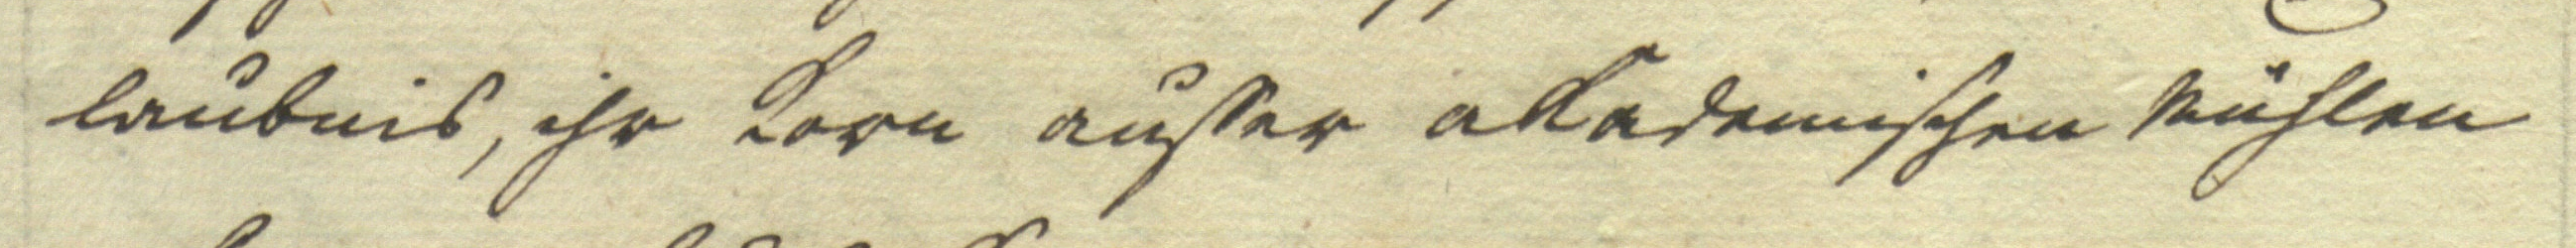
laubnis, ihr Korn ausser akademischen Mühlen
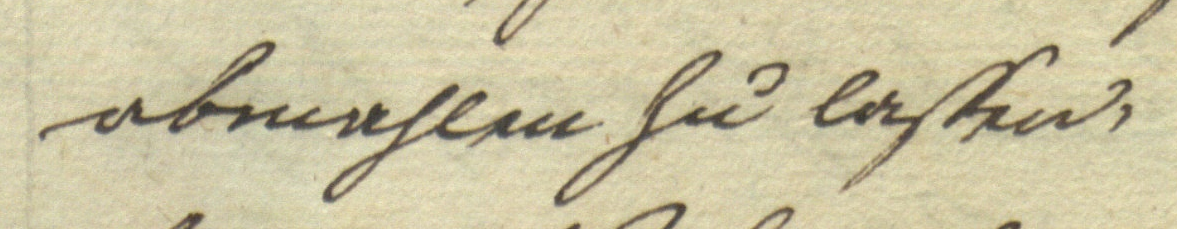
abmnahlen zu lassen,
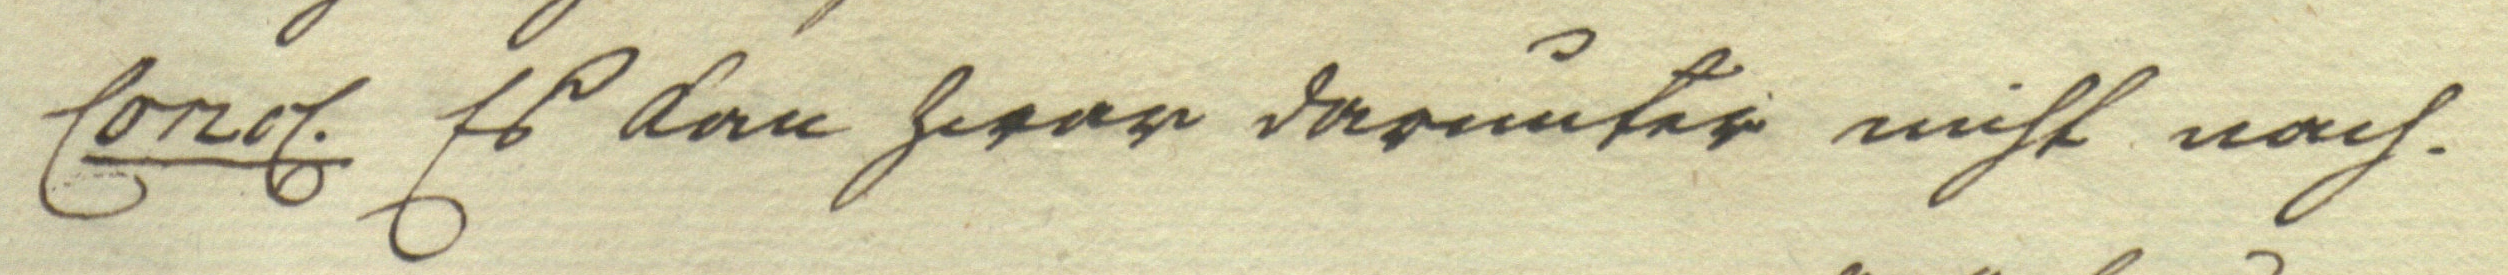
Concl. Es kan zwar darunter nicht nach¬
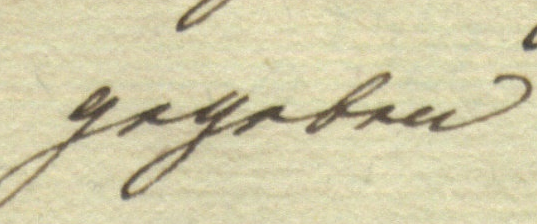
gegeben
